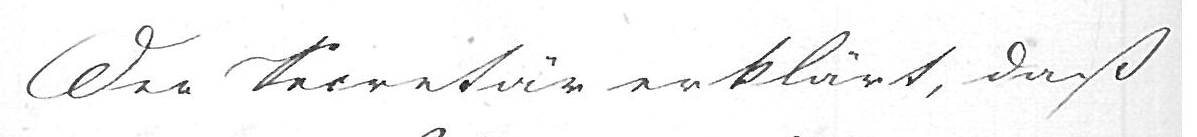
Der Secretär erklärt, daß
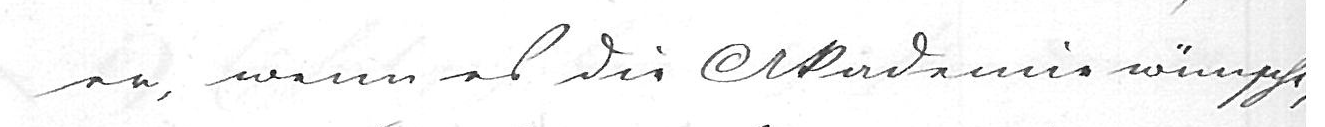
er, wenn es die Akademie wünscht,
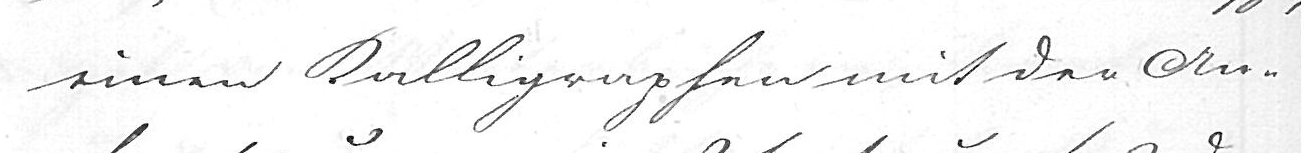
einen Kalligraphen mit der An-
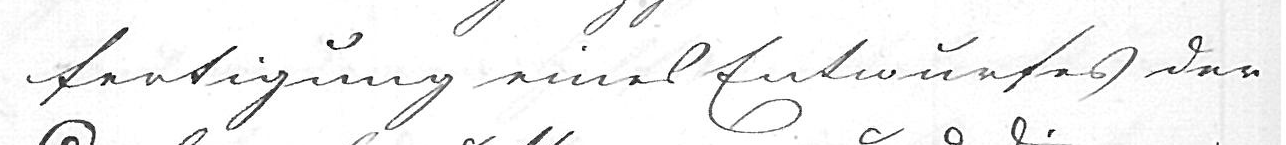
fertigung eines Entwurfes der
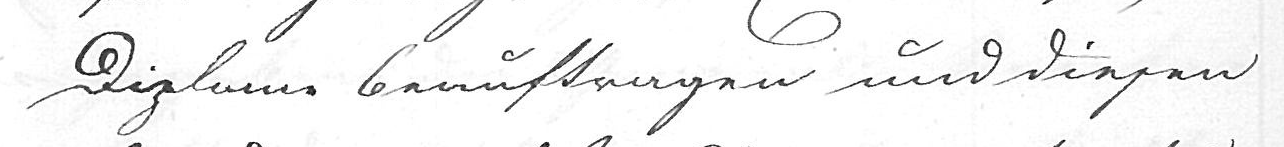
Diplome beauftragen und diesen
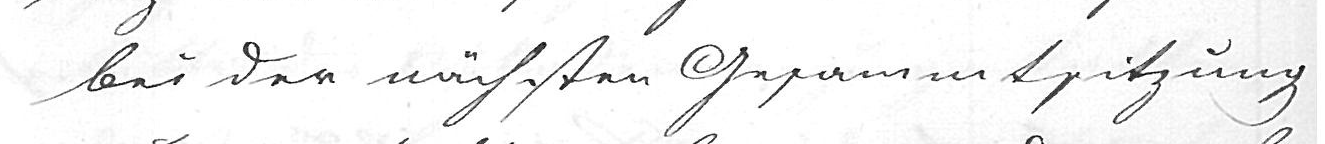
bei der nächsten Gesammtsitzung
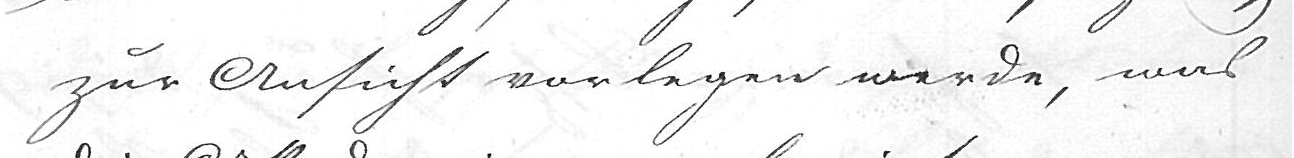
zur Ansicht vorlegen werde, was
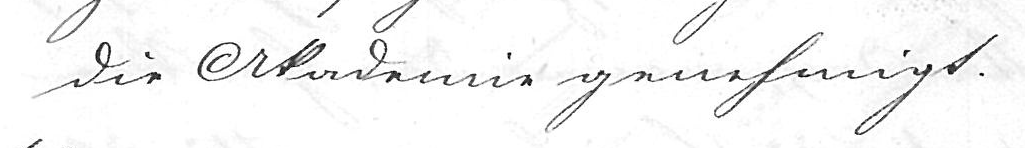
die Akademie genehmigt.
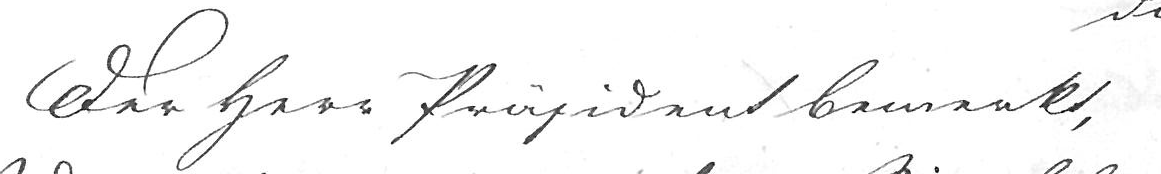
Herr Präsident bemerkt,
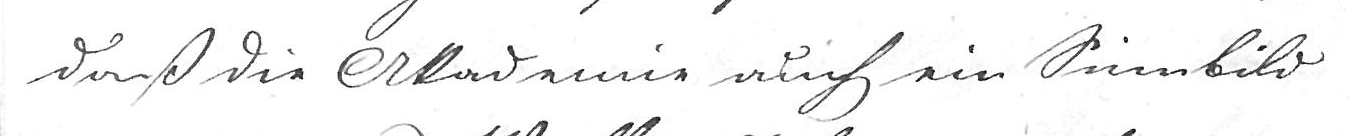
daß die Akademie auch ein Sinnbild
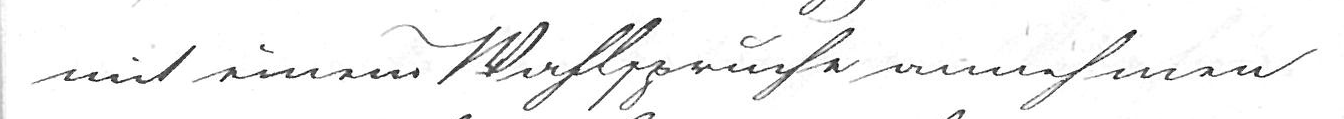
mit einen Wahlspruche annehmen
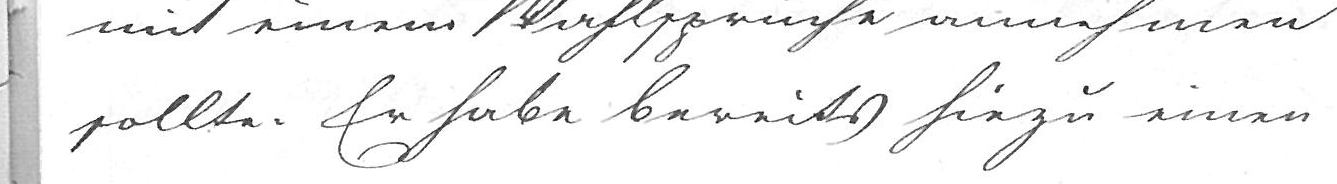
sollten. Er habe bereits hiezu einen
